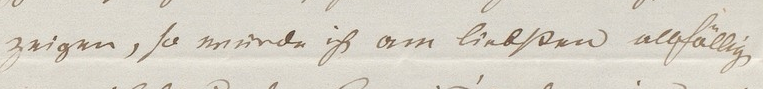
zeigen, so würde ich am liebsten allfällig
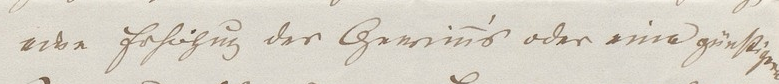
eine Erhöhung des Gewinn's oder eine günstigere
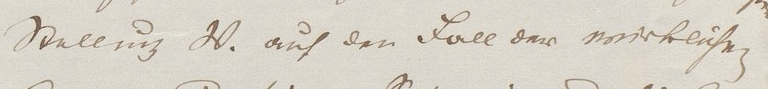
Stellung W. auf den Fall der wirklichen
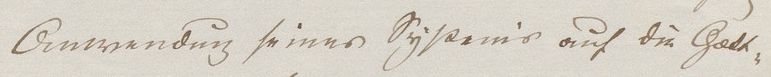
Anwendung seines System's auf die Gott-
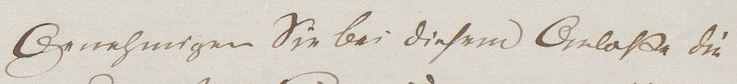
Genehmigen Sie bei diesem Anlaße die
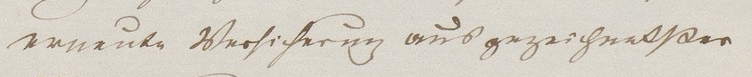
erneute Versicherung ausgezeichnetster
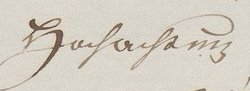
Hochachtung
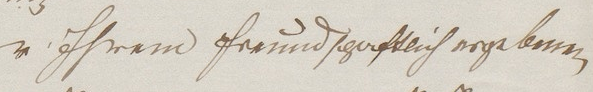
v Ihrem freundschaftlich ergebenen
